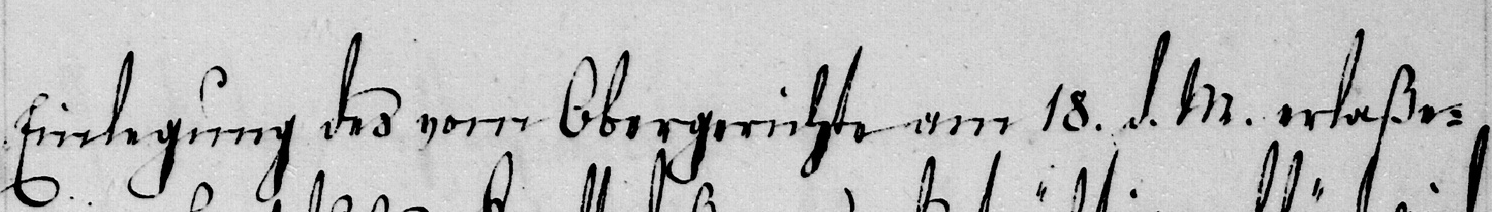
Einlegung des vom Obergerichte am 18. d. M. erlaße¬
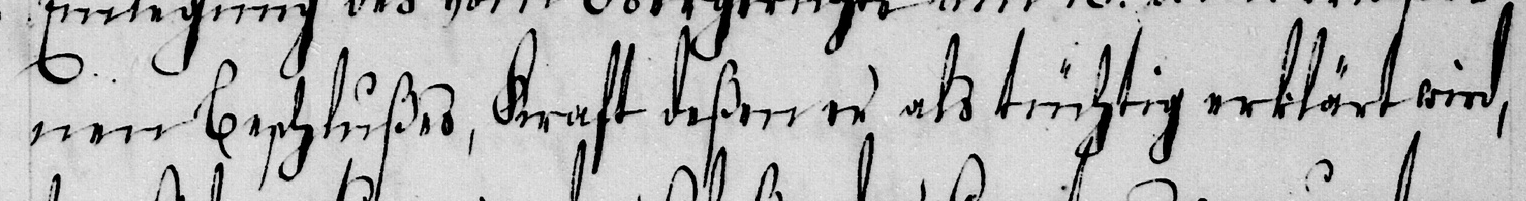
nen Beschlußes, Kraft deßen er als tüchtig erklärt wird,
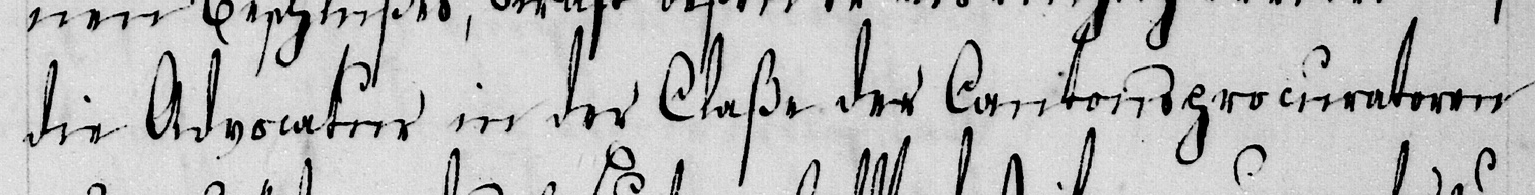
die Advocatur in der Claße der Cantonsprocuratoren
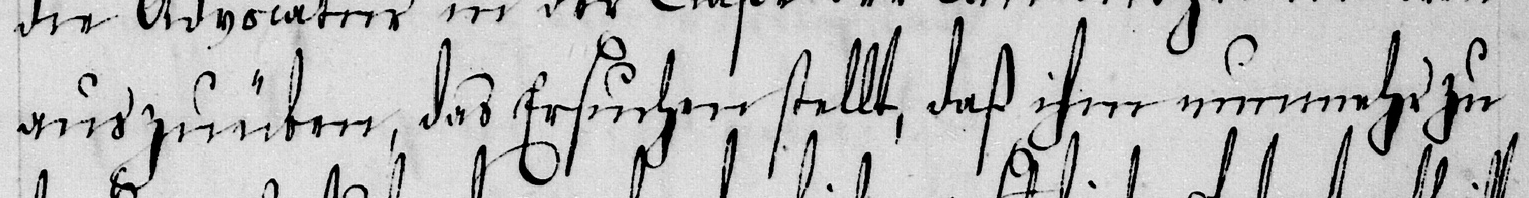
auszuüben, das Ersuchen stellt, daß ihm nunmehr zu
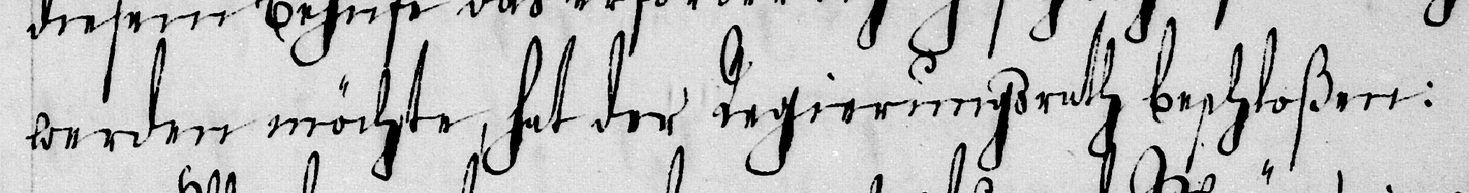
werden möchte, hat der Regierungsrath beschloßen:
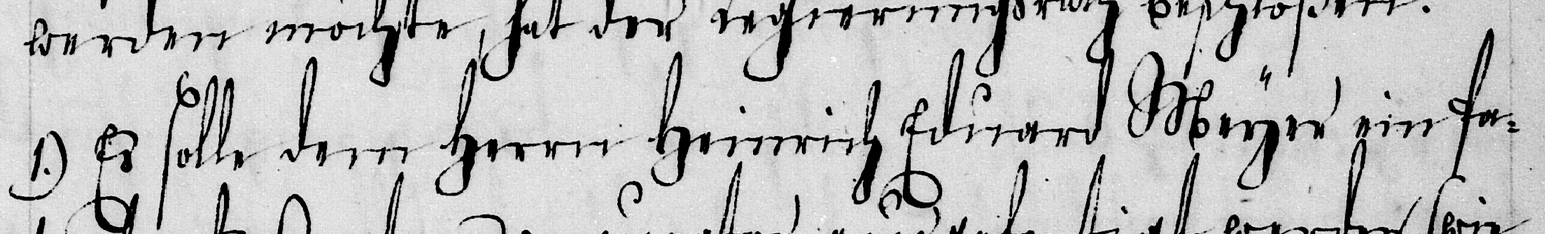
1.) Es solle dem Herrn Heinrich Eduard Meyer ein Pa¬
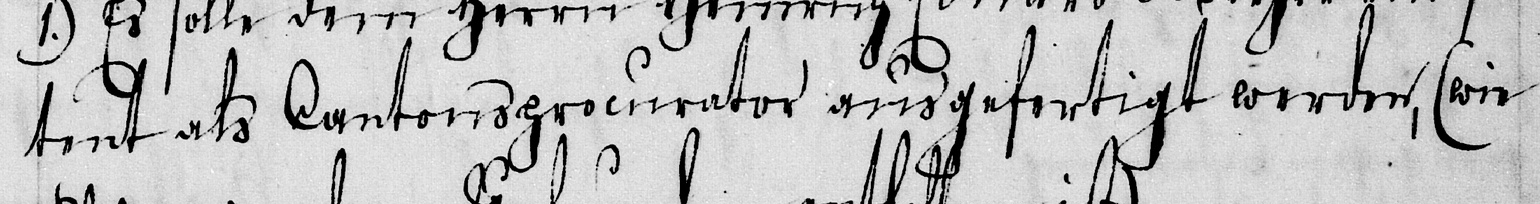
tent als Cantonsprocurator ausgefertigt werden, (wie
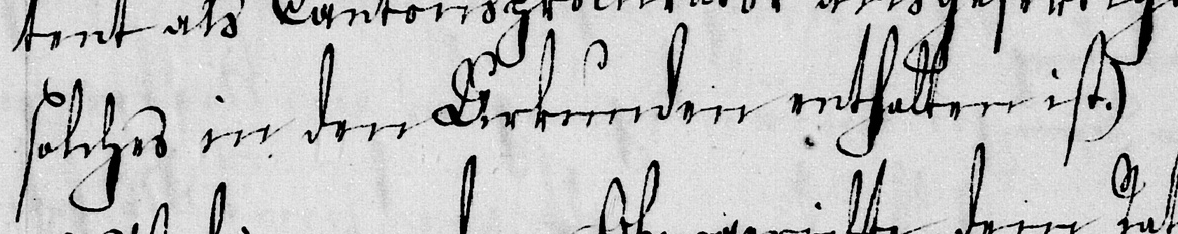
solches in den Urkunden enthalten ist.)
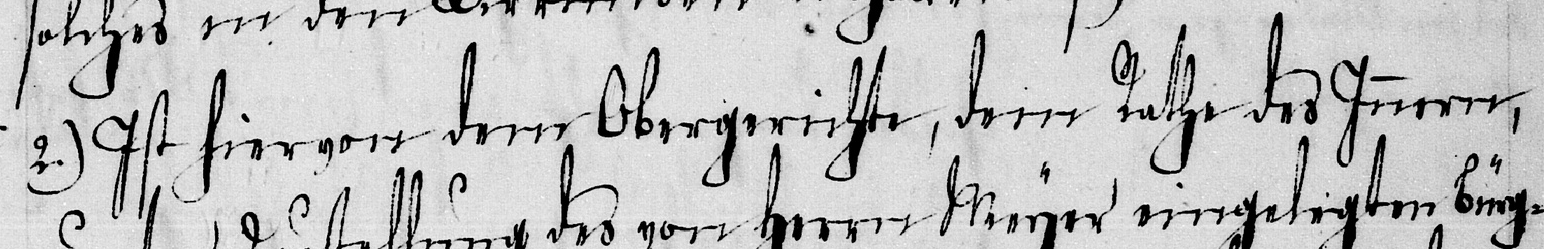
2.) Ist hiervon dem Obergerichte, dem Rathe des Innern,
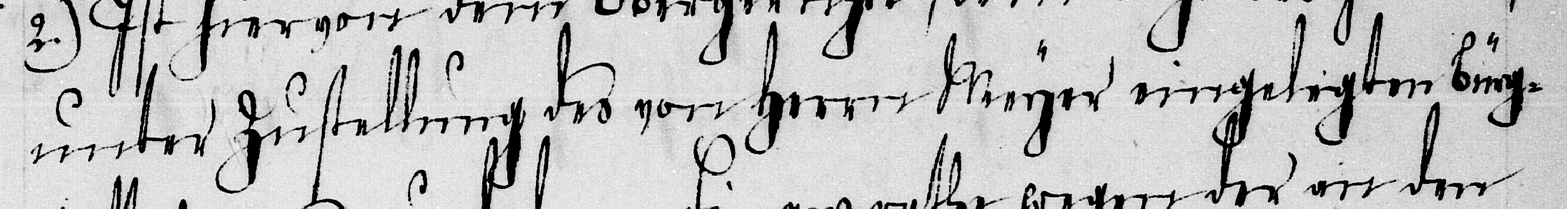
unter Zustellung des von Herrn Meyer eingelegten Bürg¬
